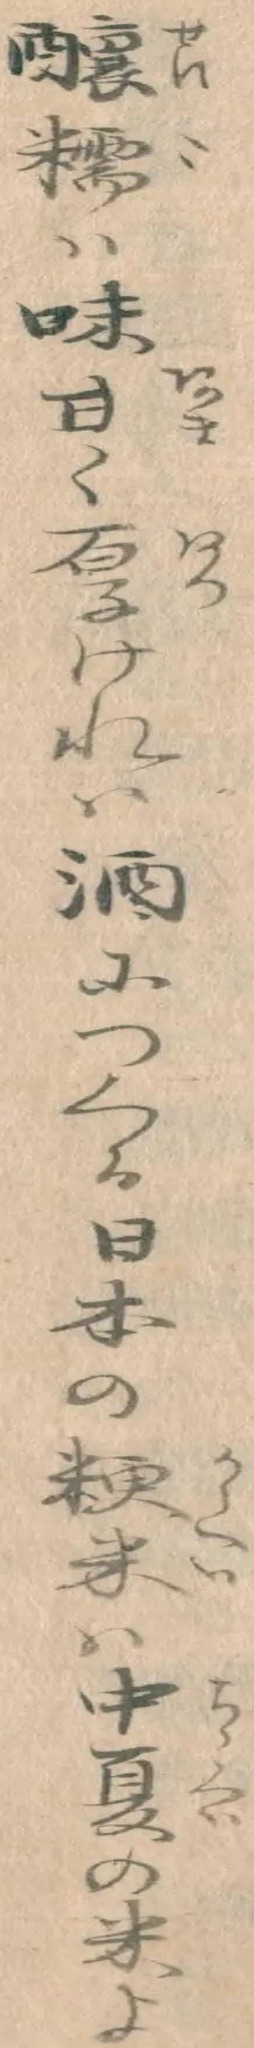醸糯は味甘く厚けれは酒につくる日本の粳米は中夏の米よ
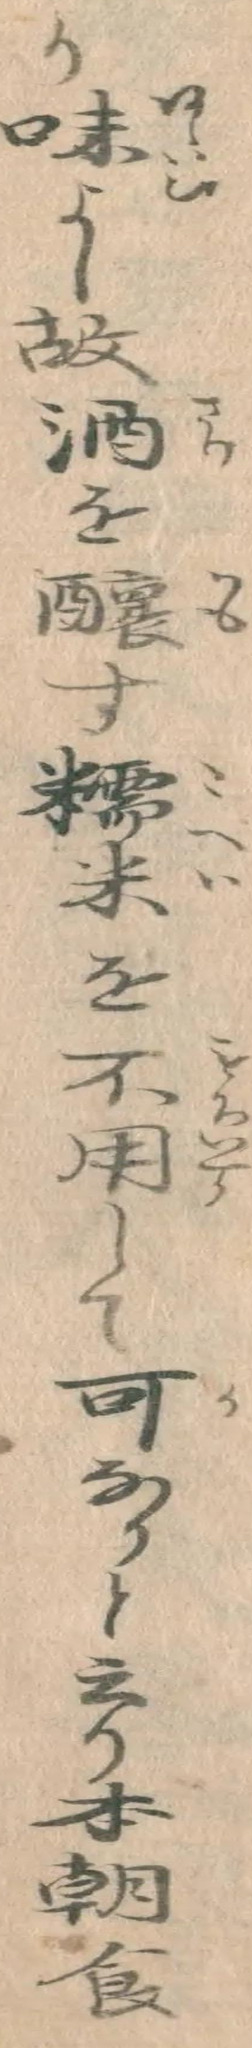り味よし故酒を醸す糯米を不用して可なりと云り本朝食
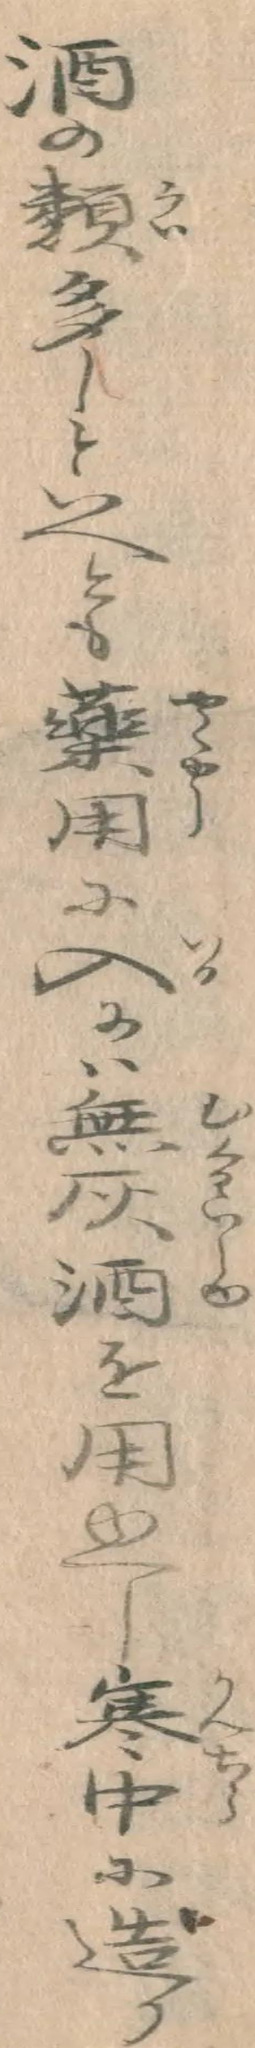酒の類多しといへとも薬用に入には無灰酒を用ゆへし寒中に造り
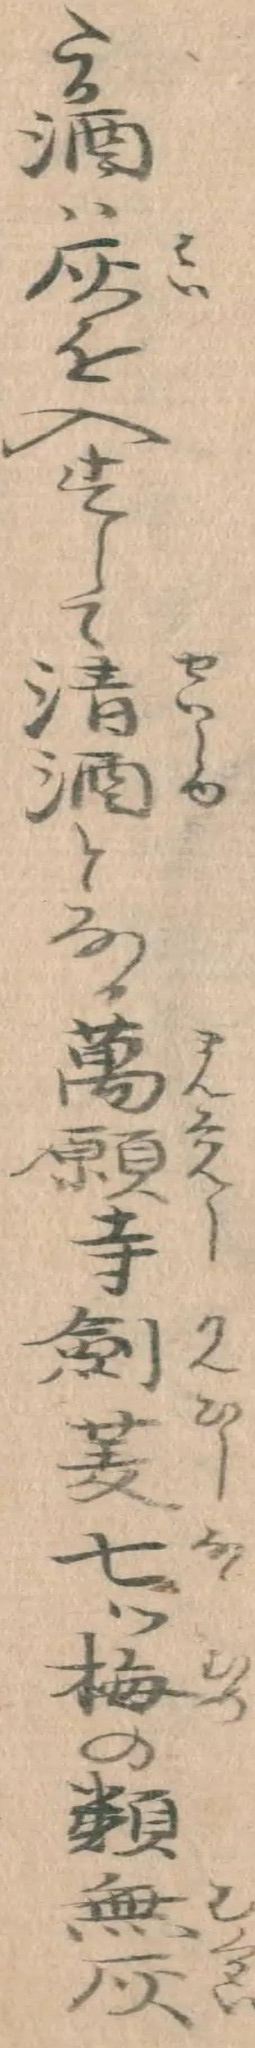たる酒は灰を入すして清酒となる万願寺剣菱七ッ梅の類無灰
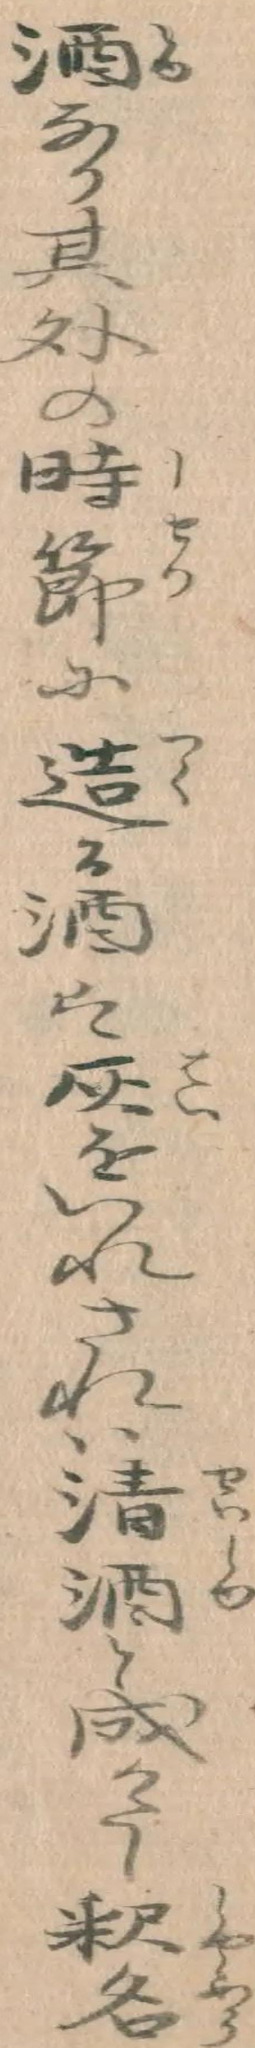酒なり其外の時節に造る酒は灰をいれされは清酒と成かたし釈名
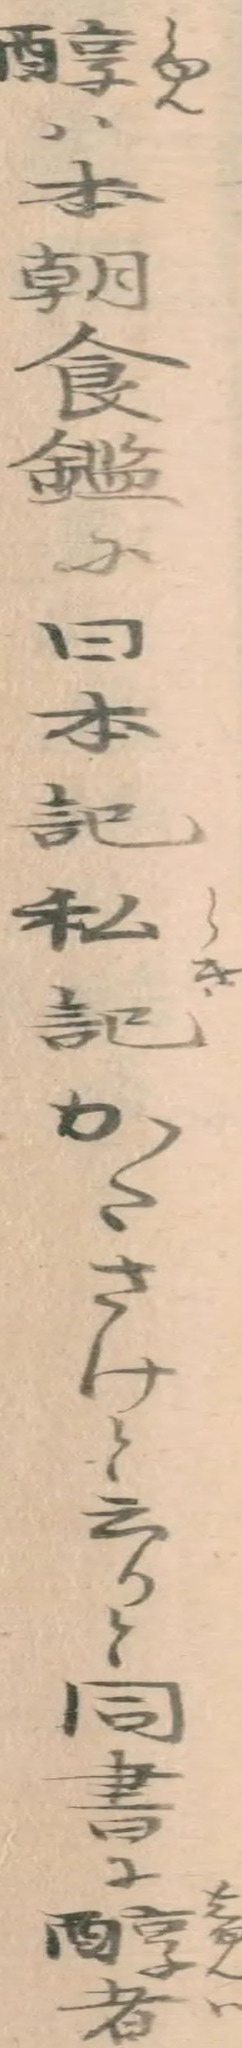醇は本朝食鑑に日本記私記かたさけと云りと同書に醇者
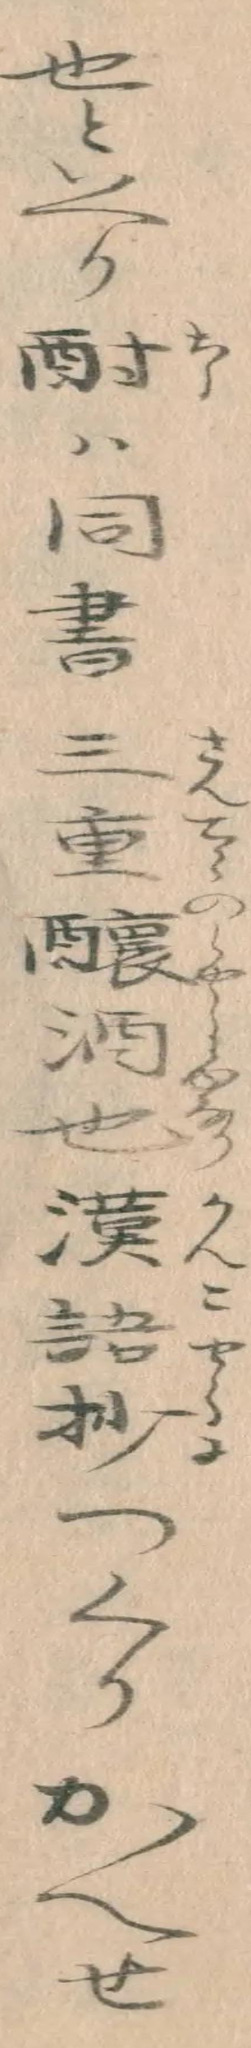也といへり酎は同書三重醸酒也漢語抄つくりかへせ

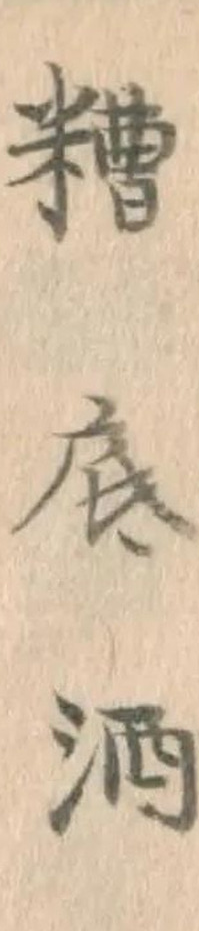糟底酒
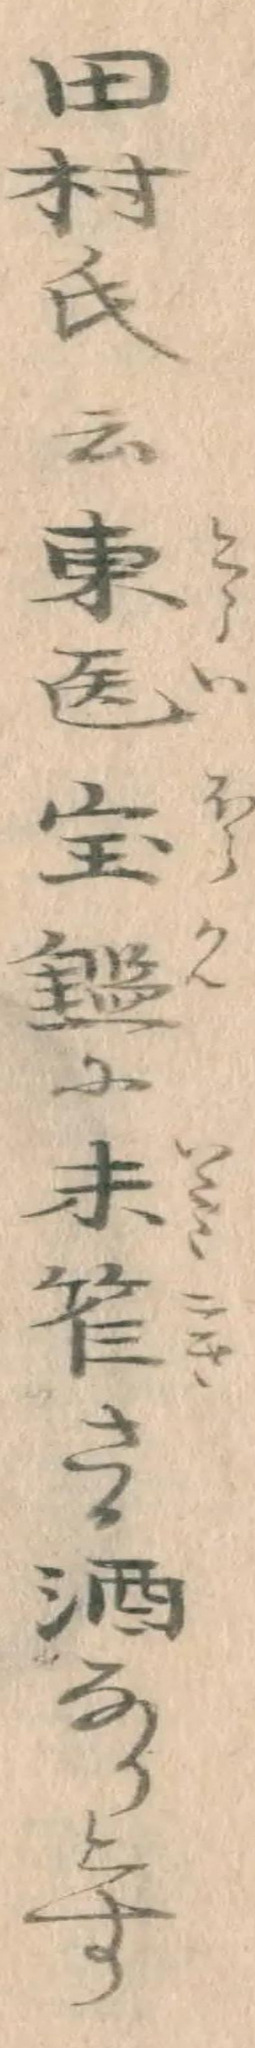田村氏云東医宝鑑に未笮さる酒なりとす
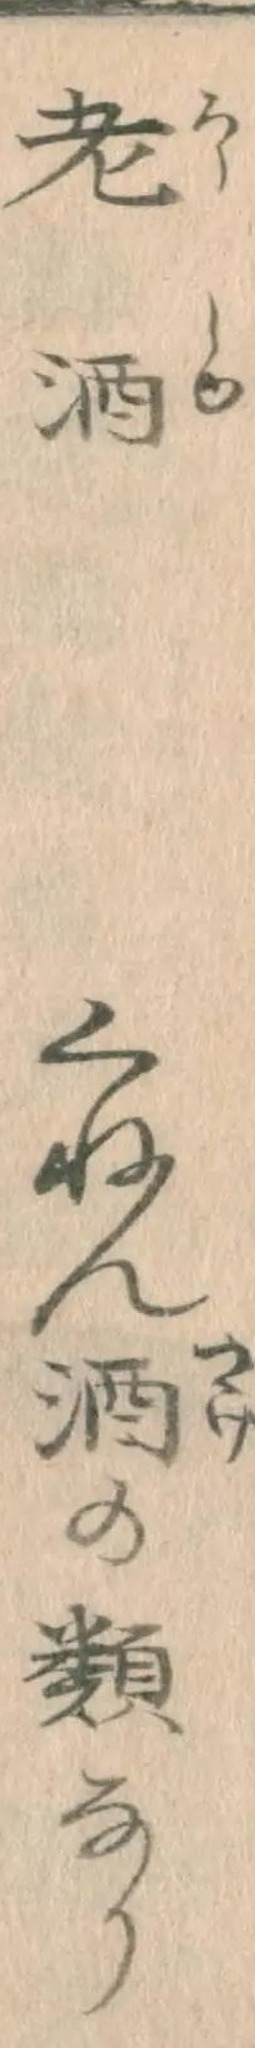老酒くねん酒の類なり
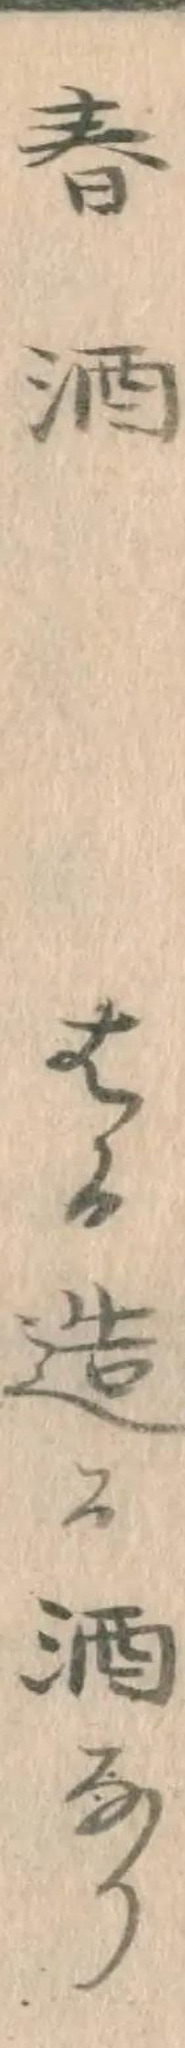春酒はる造る酒なり
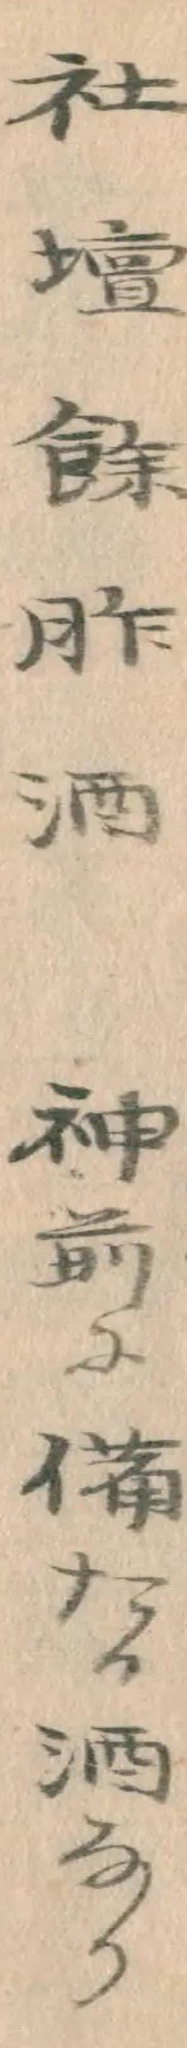社壇余胙酒神前に備たる酒なり
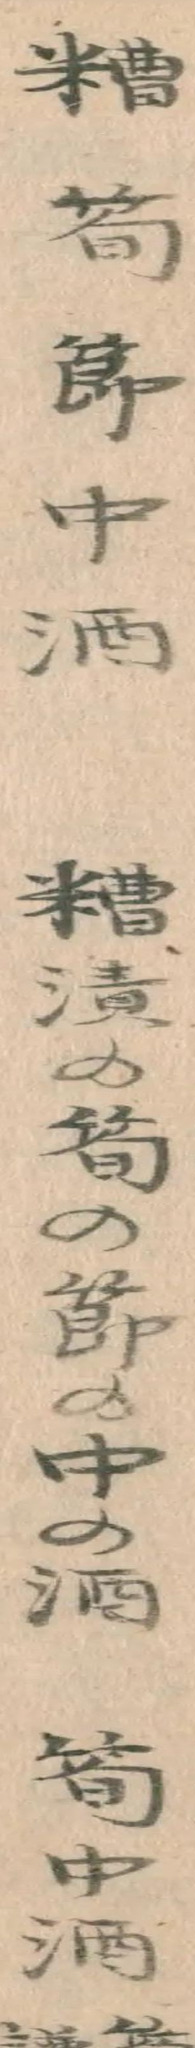糟筍節中酒糟漬の筍の節の中の酒筍中酒筍譜
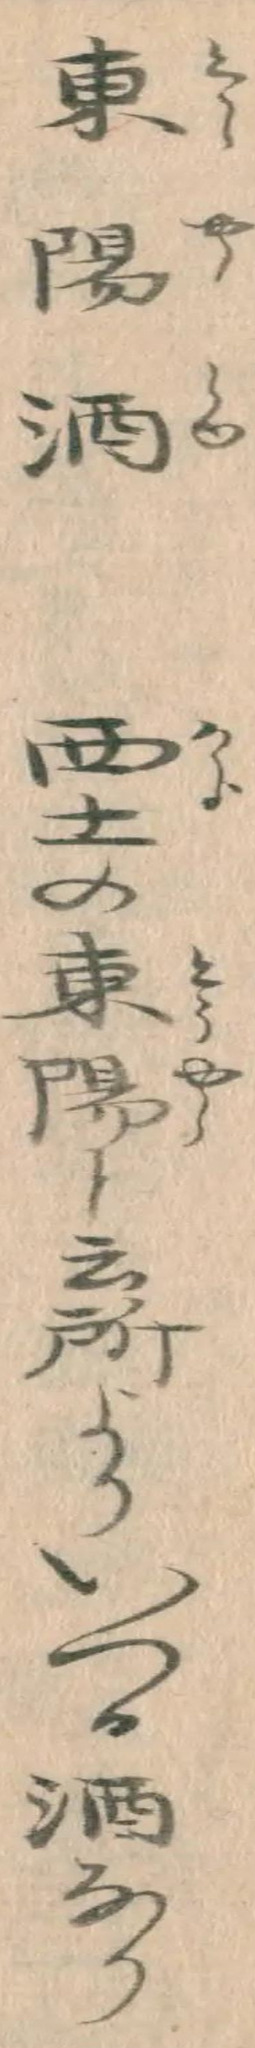東陽酒西土の東陽と云所よりいつる酒なり
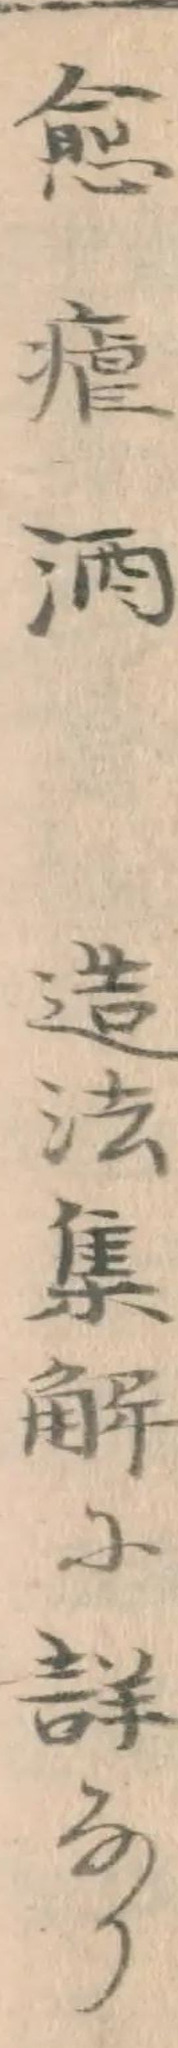愈瘧酒造法集解に詳なり
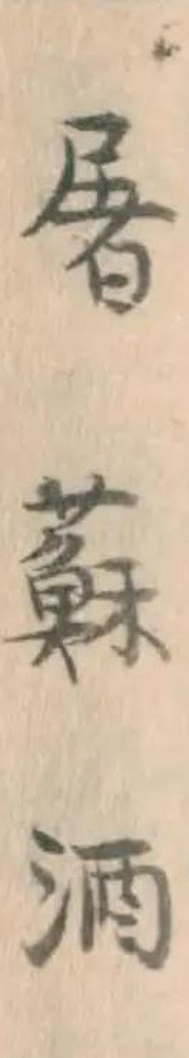屠蘇酒
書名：本草図譜. 巻43-45
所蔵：国立国会図書館 National Diet Library, JAPAN
